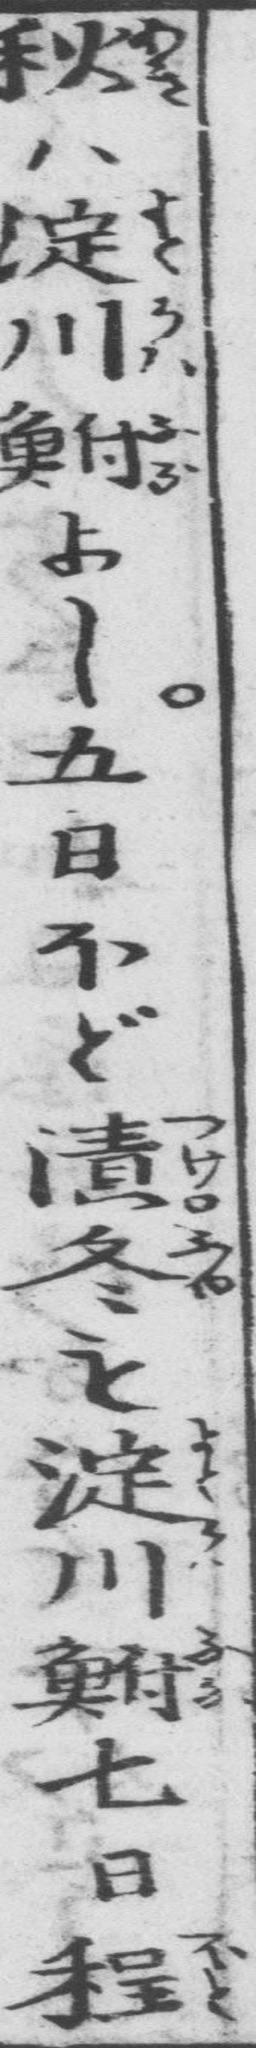秋は淀川鮒よし。五日ほど漬。冬も淀川鮒七日程
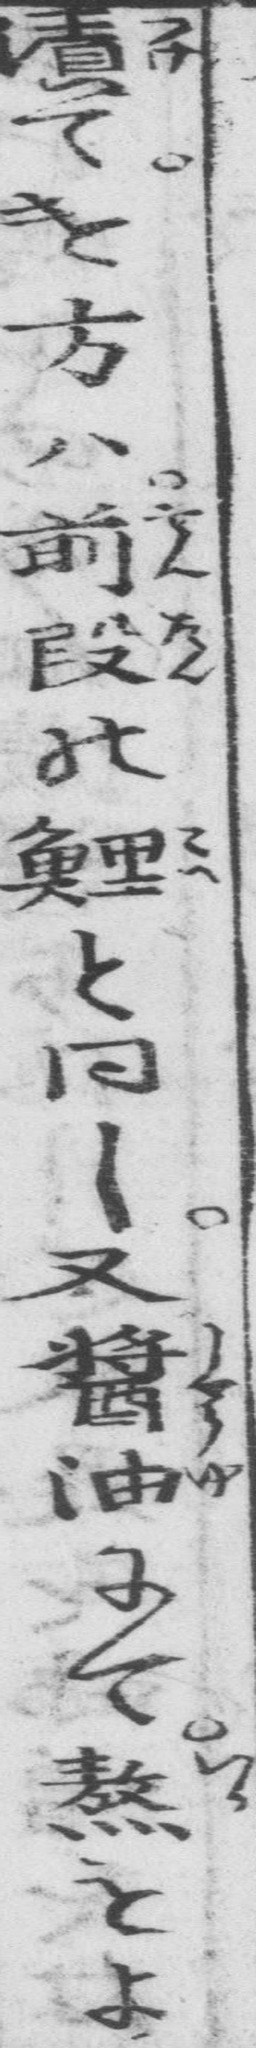漬て。遣方は。前段の鯉と同し。又醤油にて。熬もよ
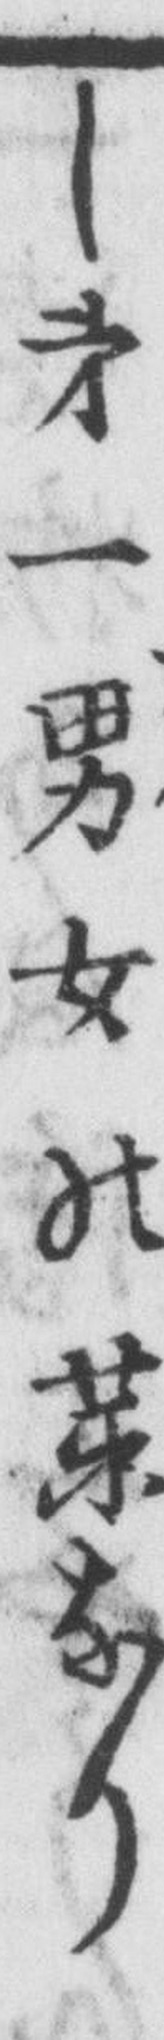し。第一男女の薬なり
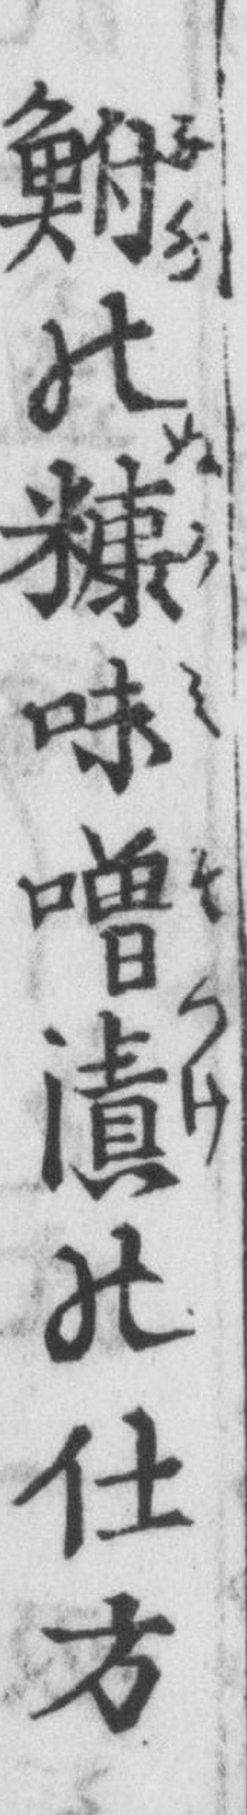鮒の糠味噌漬の仕方
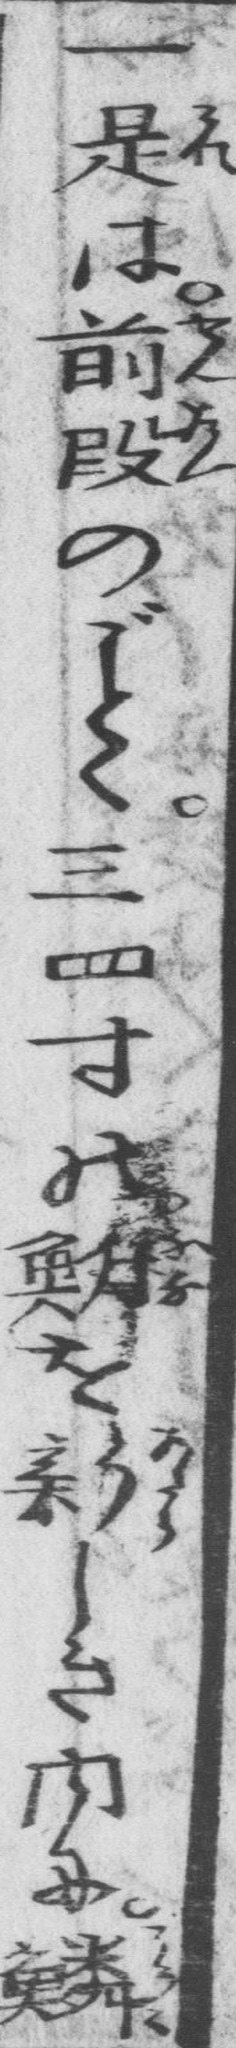一是は。前段のごとく、三四寸の。鮒を新しき内に。鱗
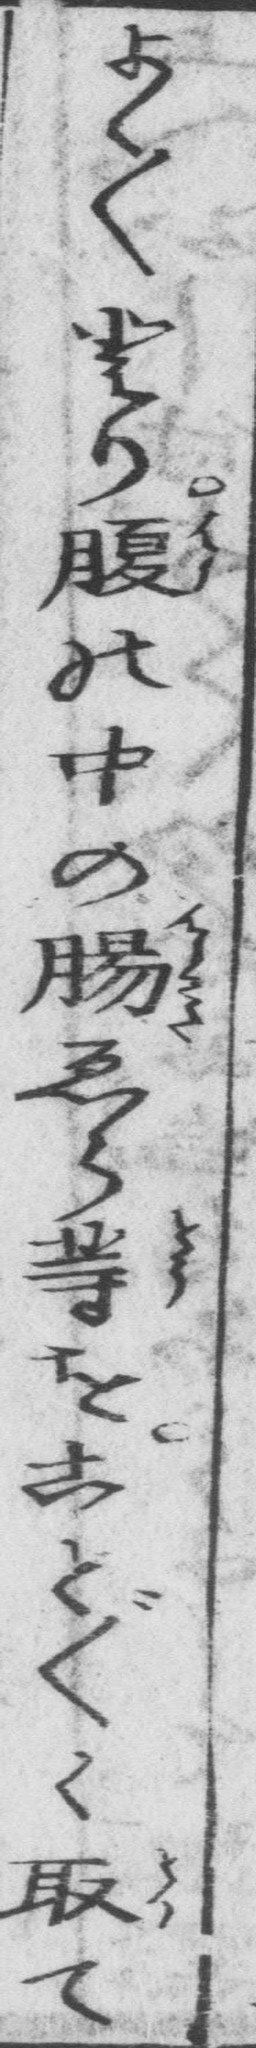よく〳〵とり。腹の中の腸ゑら等を。こと〴〵く取て
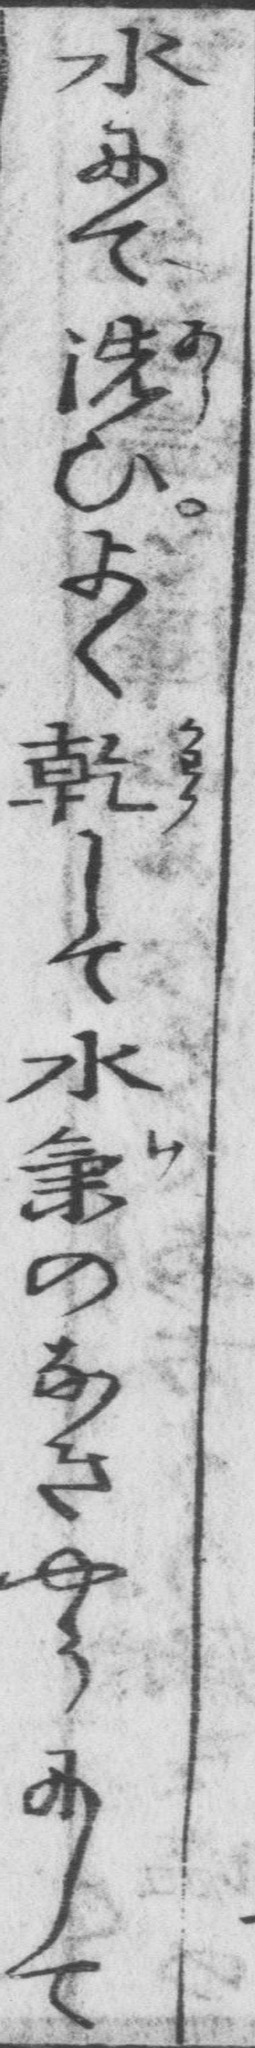水にて洗ひ。よく乾して水気のなきやうにして
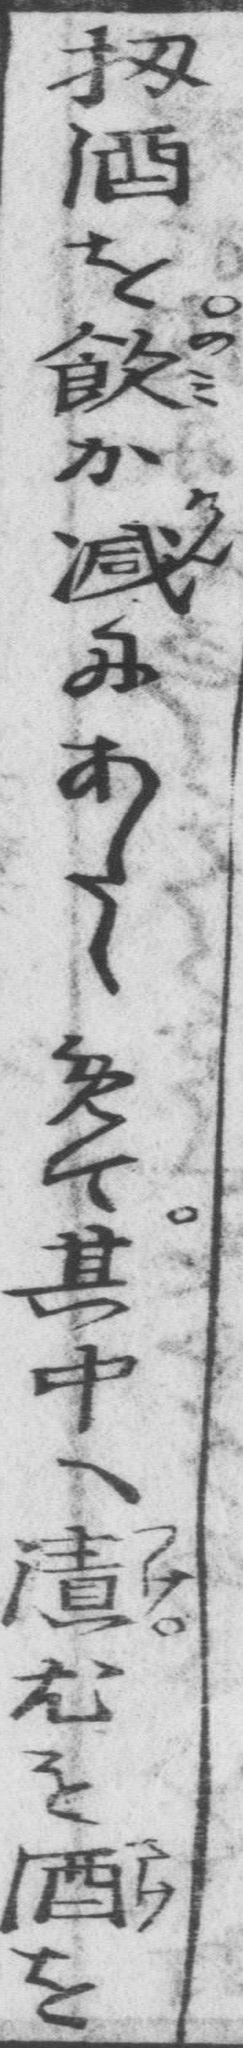扨酒を。飲か減にあたゝめて。其中へ漬。尤も酒を
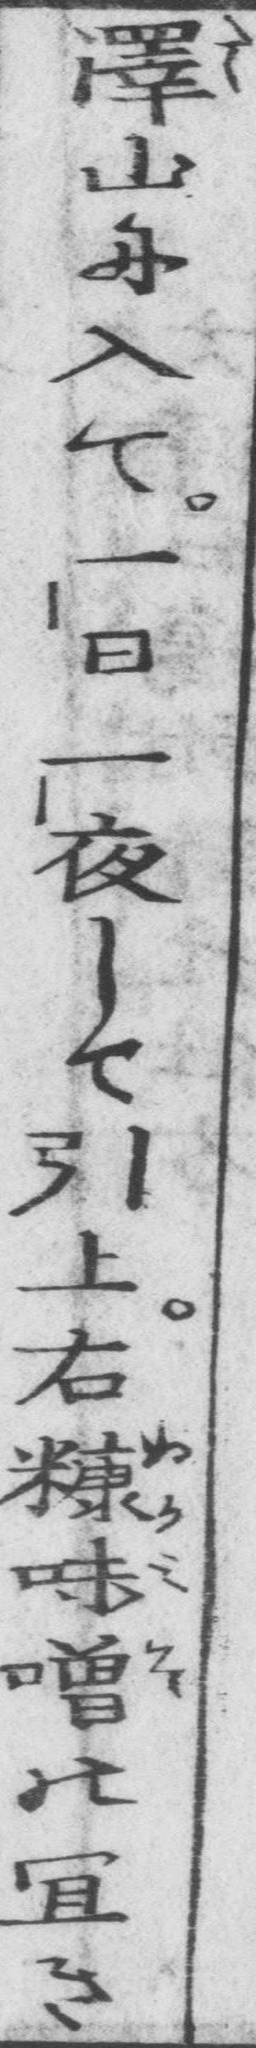沢山に入て。一日一夜して引上。右糠味噌の宜き
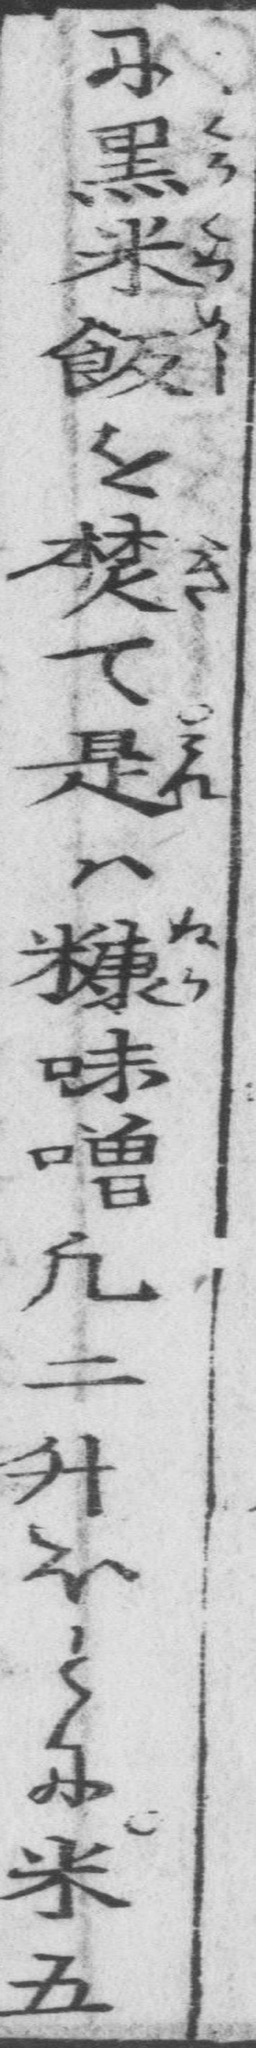に黒米飯を焚て。是は糠味噌凡弐升ほとに。米五
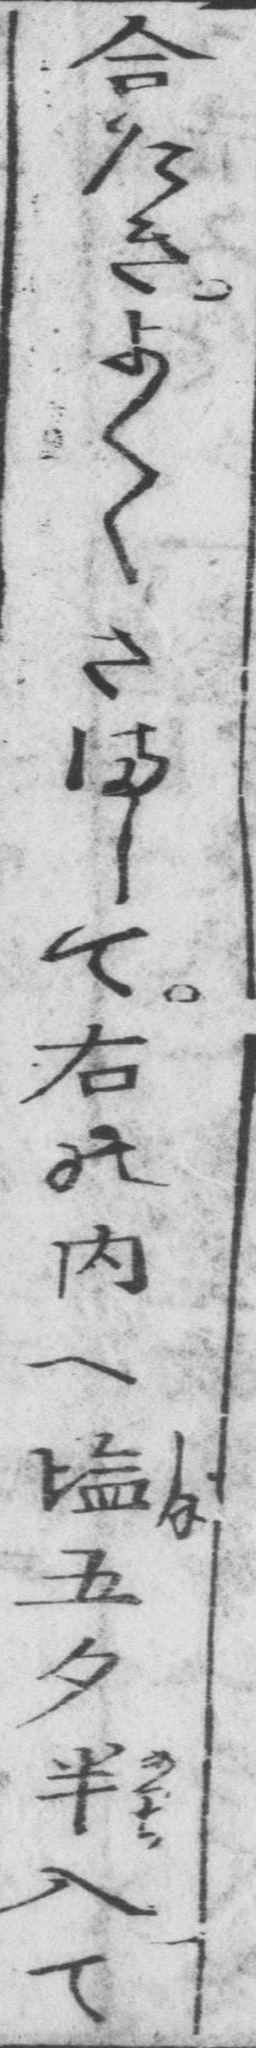合たき。よく〳〵さまして。右の内へ塩五勺半入て
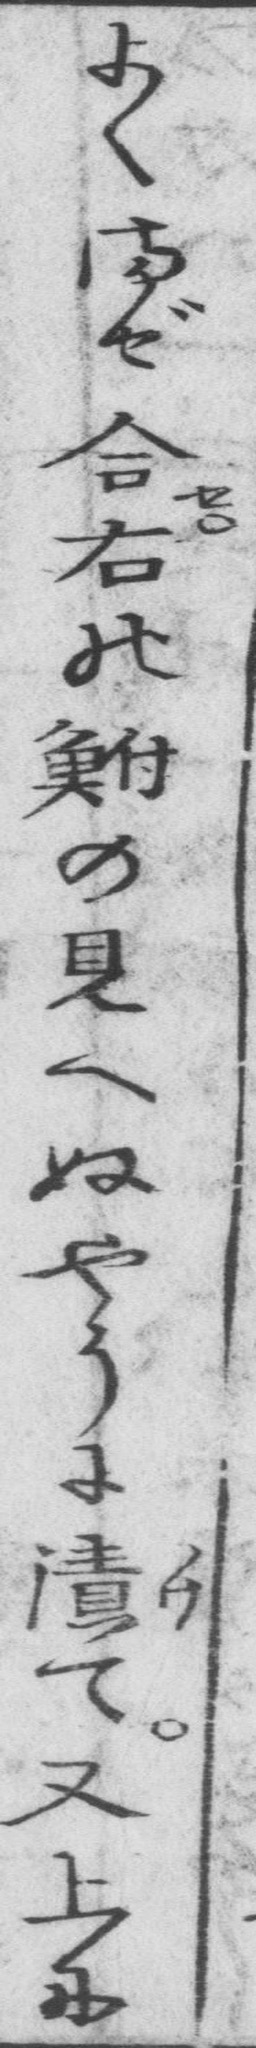よくまぜ合せ。右の鮒の見へぬやうに漬て。又上に
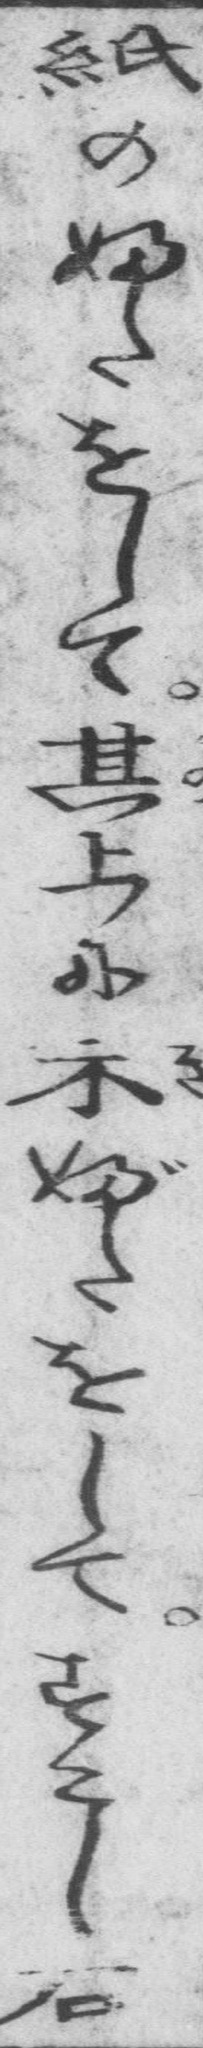紙のふたをして。其上に木ぶたをして。すこし石

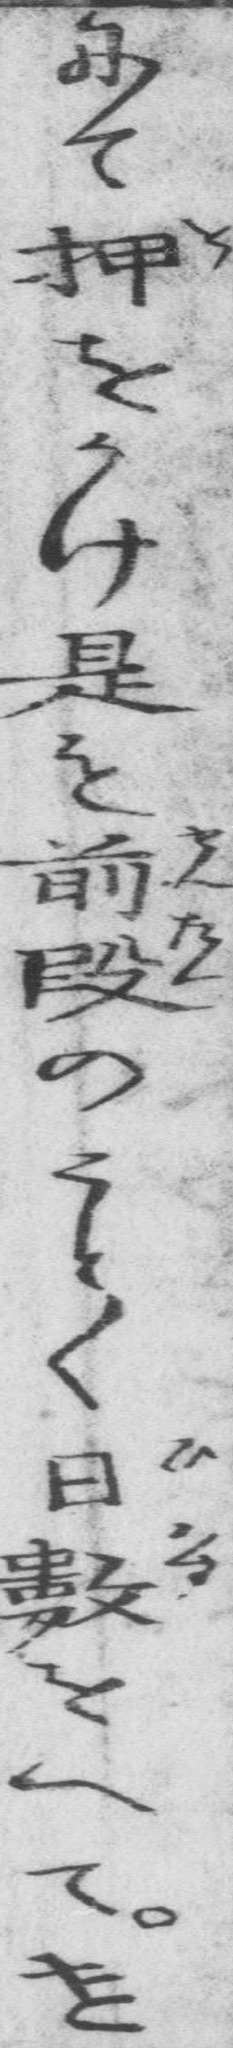にて押をかけ是も前段のことく日数をへて。遣
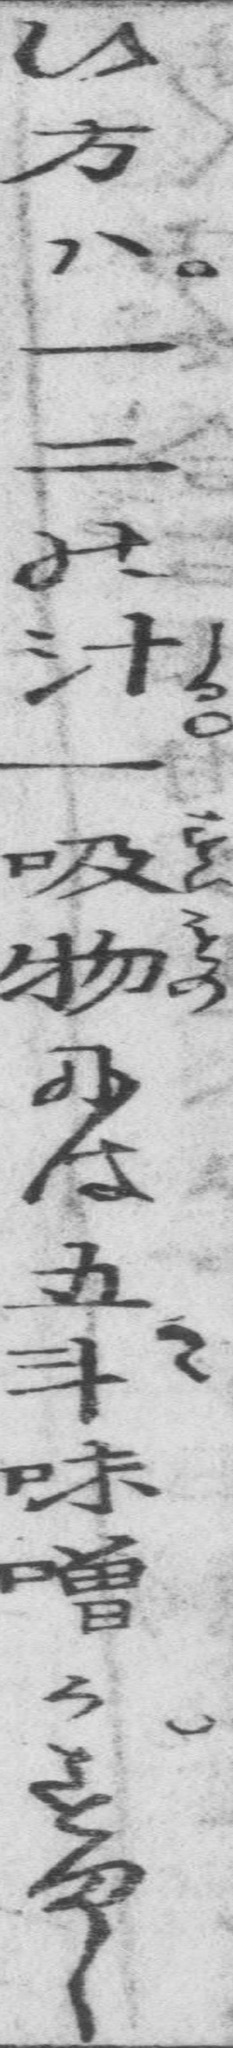ひ方は。一二の汁。一吸物には五斗味噌か。すまし
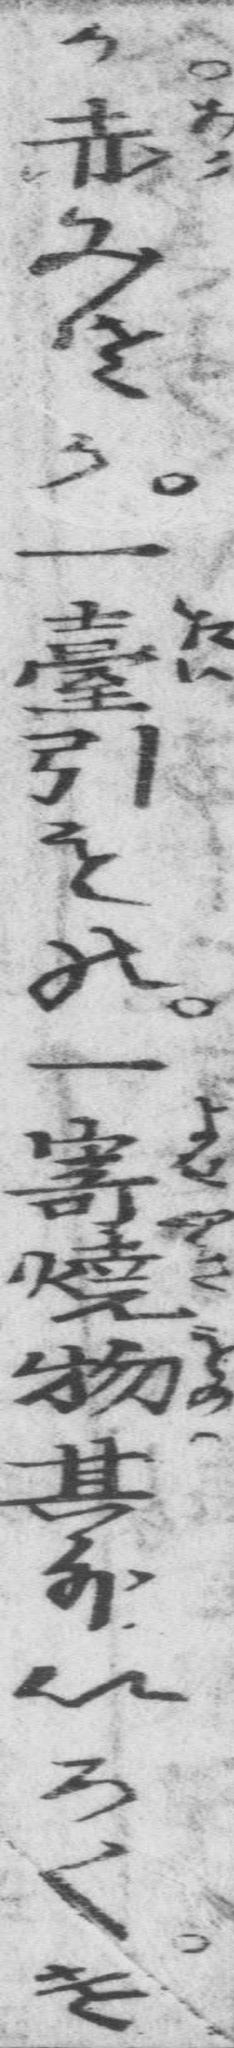か。赤みそか。一台引もの。一寄焼物。其外いろ〳〵。遣
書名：萬寳料理秘密箱
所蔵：大阪府立大学学術情報センター 国文学研究資料館
